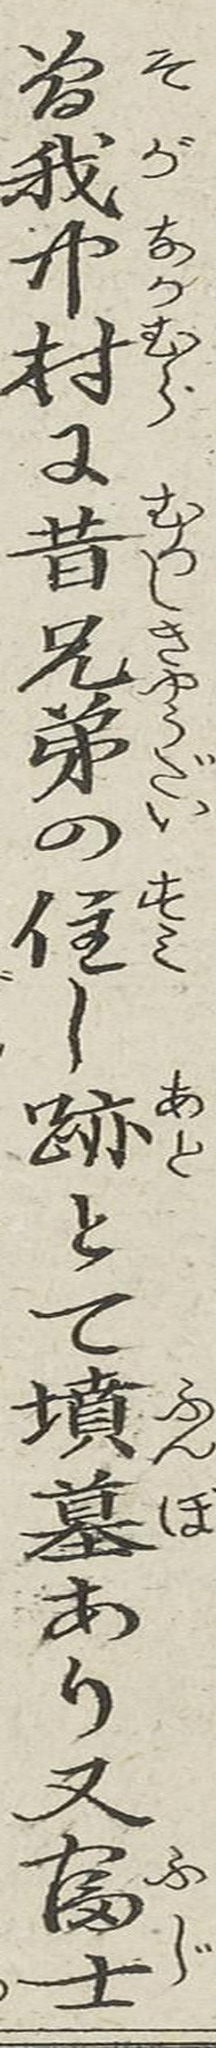曽我中村に昔兄弟の住し跡とて墳墓あり又富士
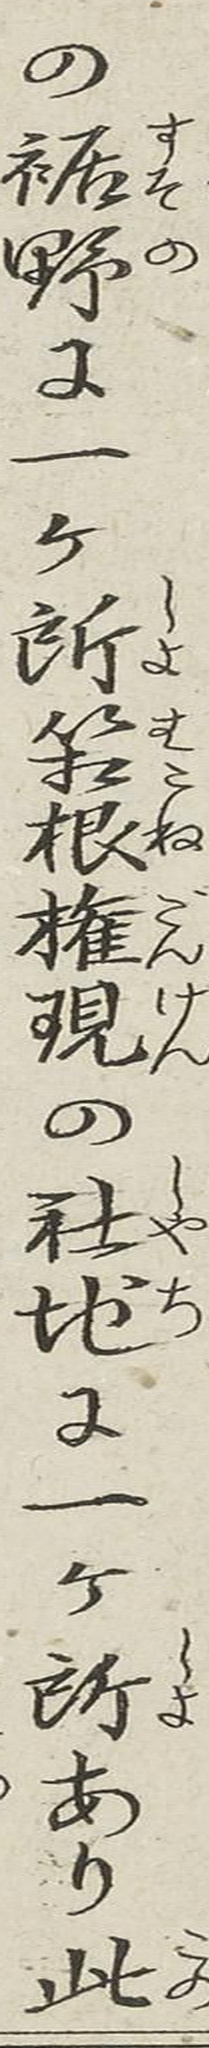の裾野に一ケ所箱根権現の社地に一ケ所あり此
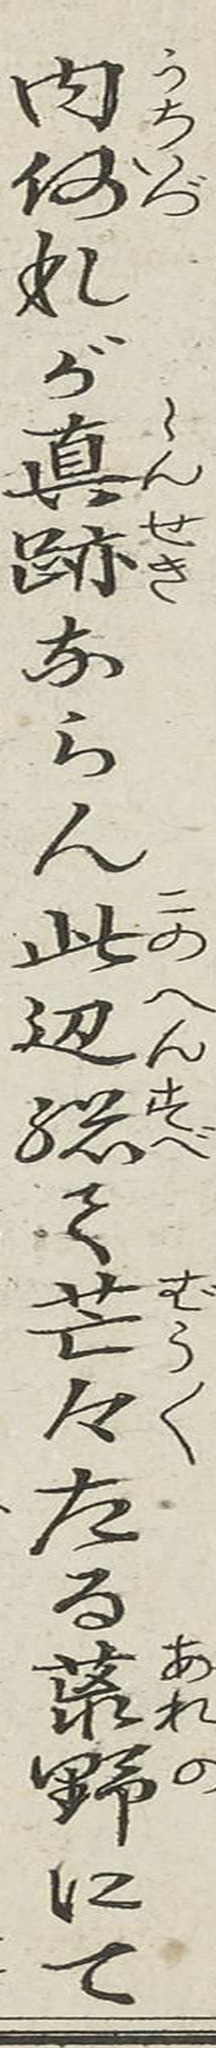内何れが真跡ならん此辺諸て芒々たる荒野にて
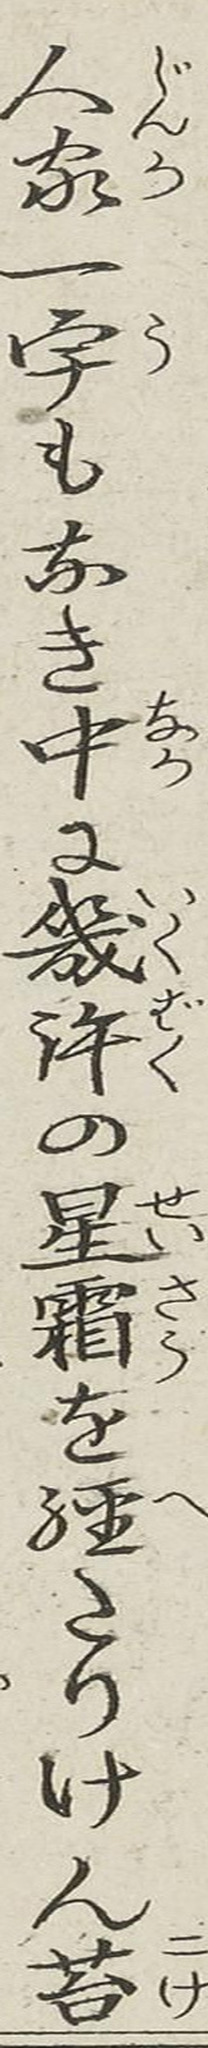人家一宇もなき中に幾許の星霜を経たりけん苔
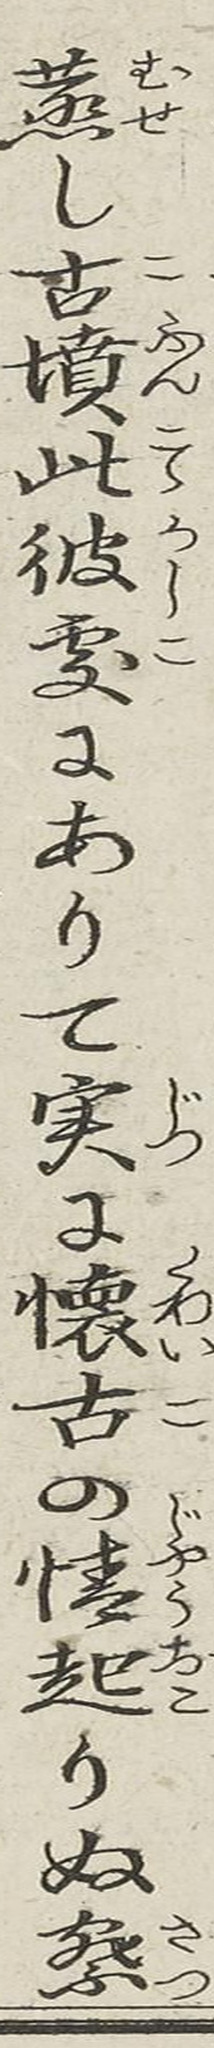蒸し古墳此彼処にありて実に懐古の情起りぬ察
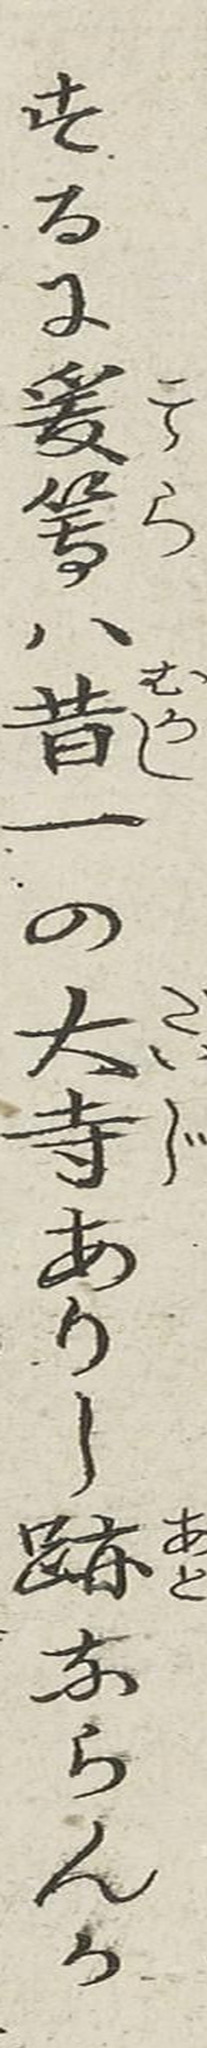するに爰等は昔一の大寺ありし跡ならんか
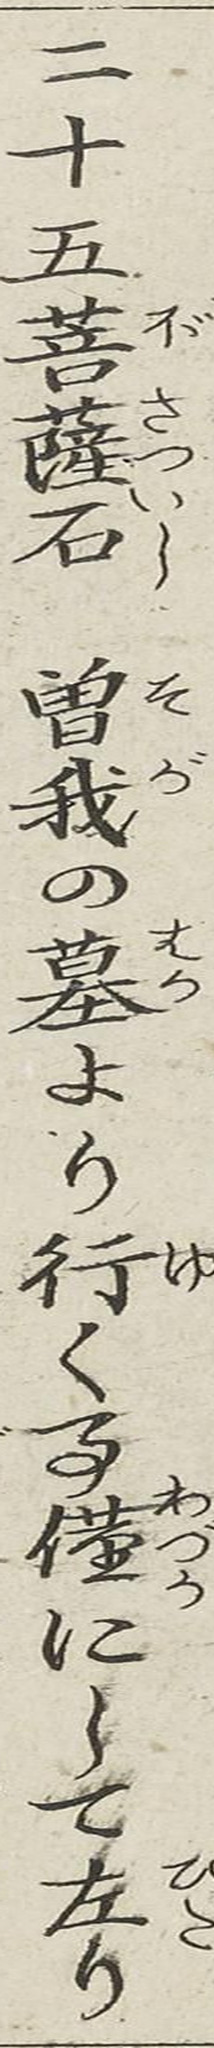二十五菩薩石曽我の墓より行く事僅にして左り
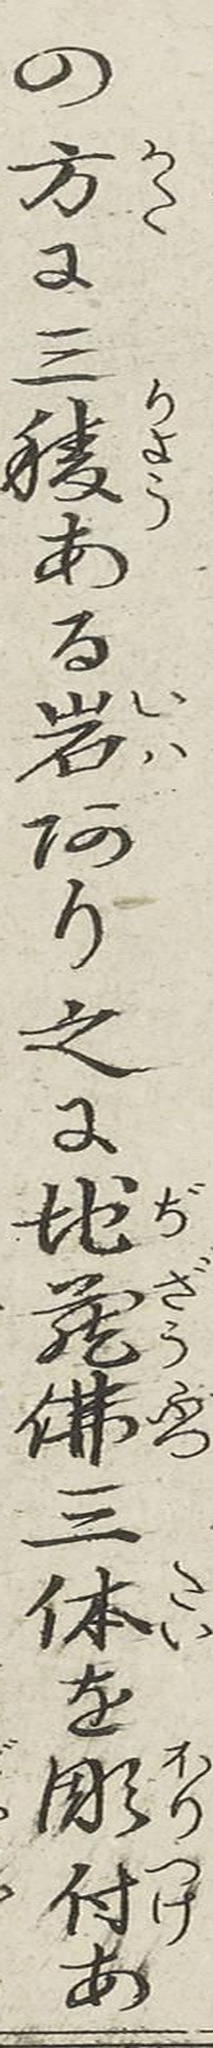の方に三稜ある岩あり之に地蔵仏三体を彫付あ
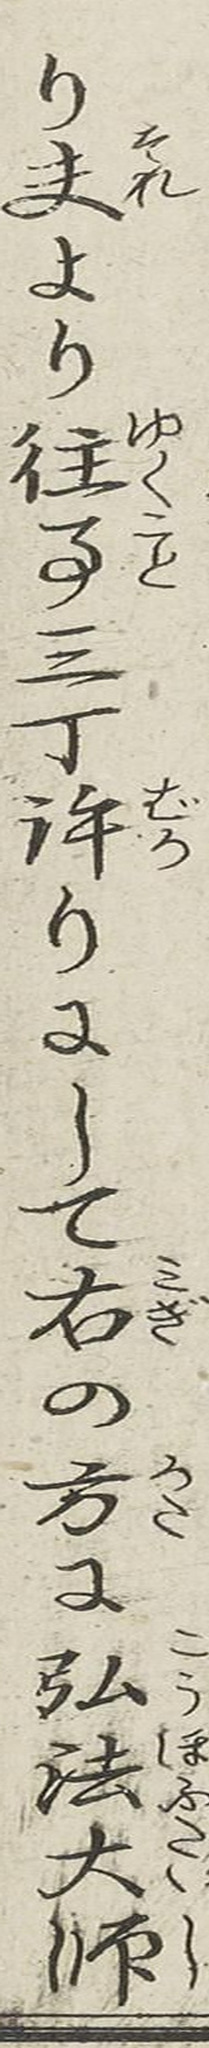り夫より往事三丁許りにして右の方に弘法大師
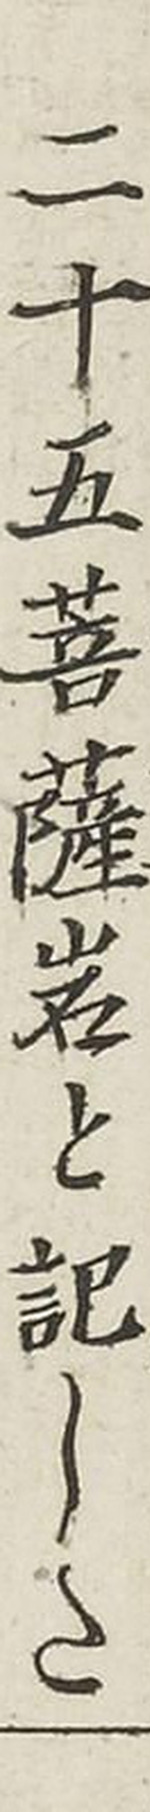二十五菩薩岩と記した
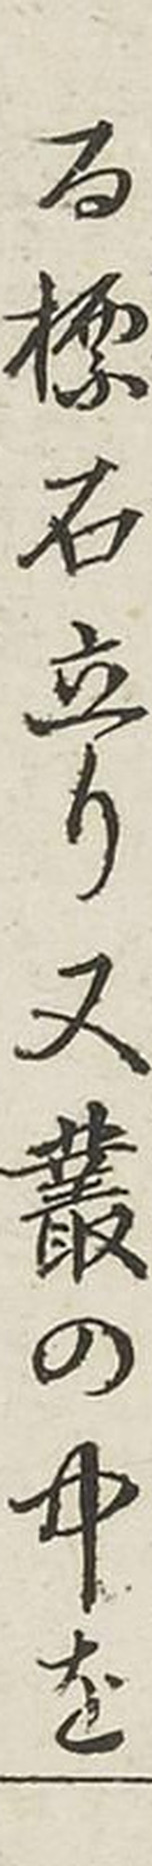る標石立り又叢の中を
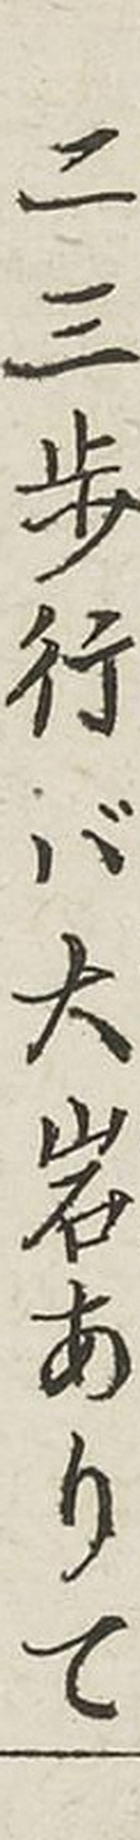二三歩行ば大岩ありて多
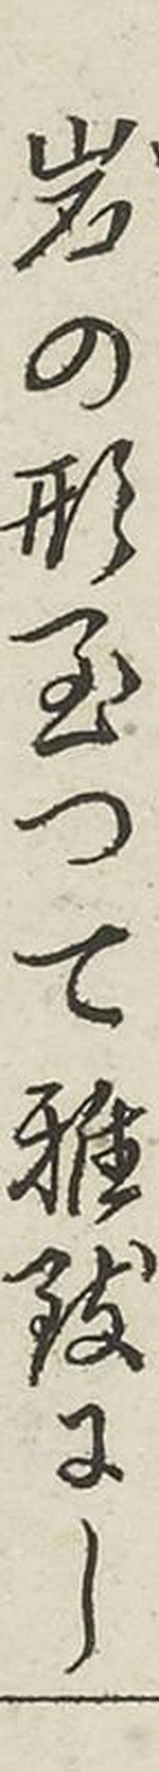岩の形至つて雅致にし
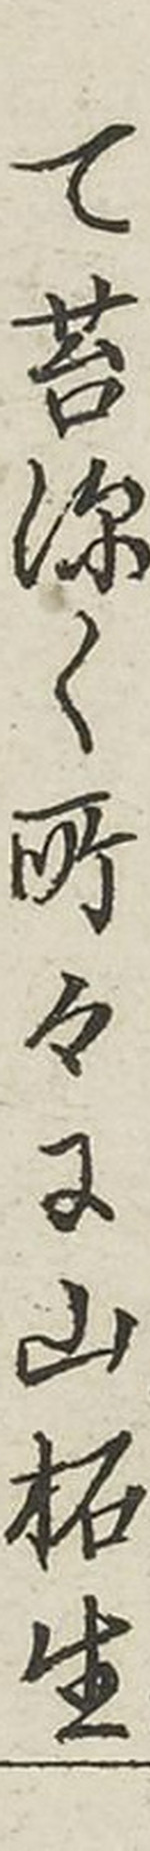て苔深く所々に山拓生

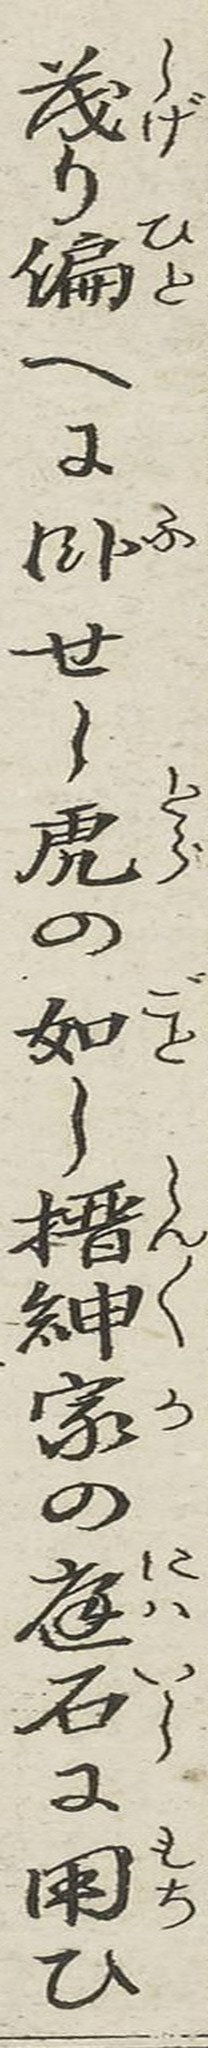茂り偏へに臥せし虎の如し搢紳家の庭石に用ひ
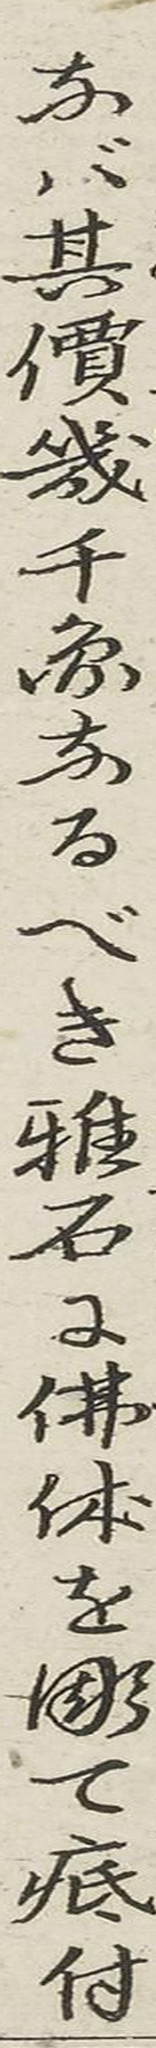なば其價幾千圓なるべき雅石に佛体を彫て疵付
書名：箱根温泉誌　全
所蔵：東京大学地震研究所図書室 Earthquake Research Institute Library, The University of Tokyo, JAPAN
